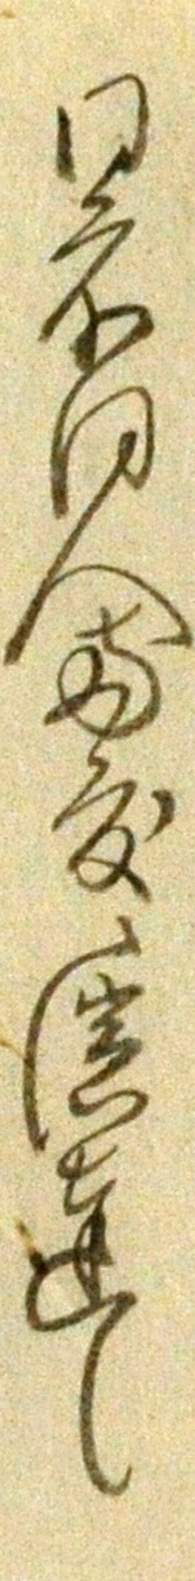同前同人両度演達之
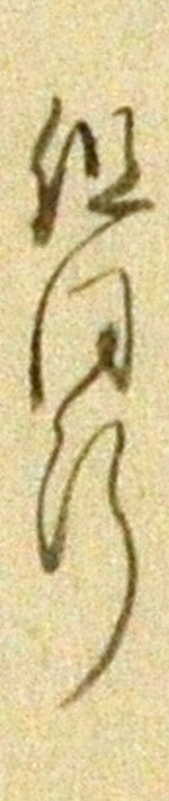但同断
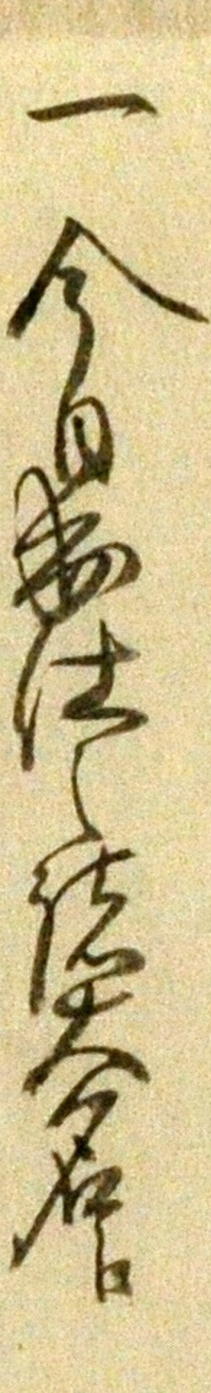一今日出仕之諸大名え
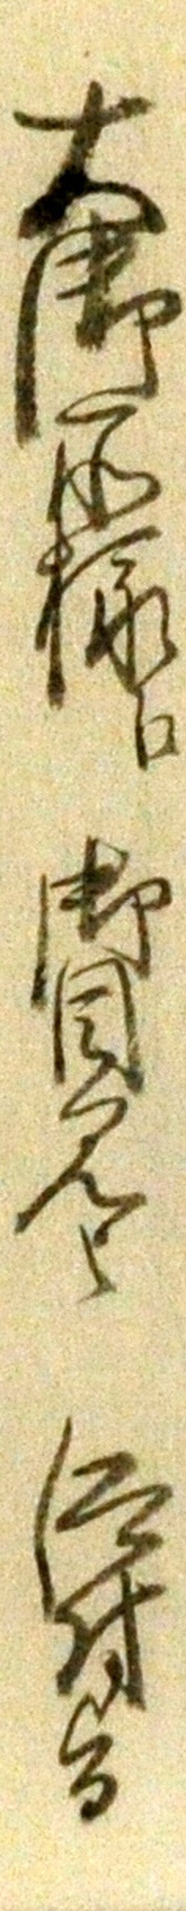大御所様え御目見被仰付旨
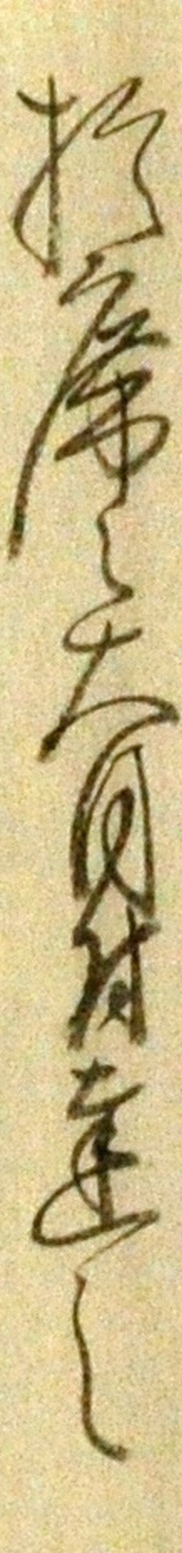於席之大目付達之
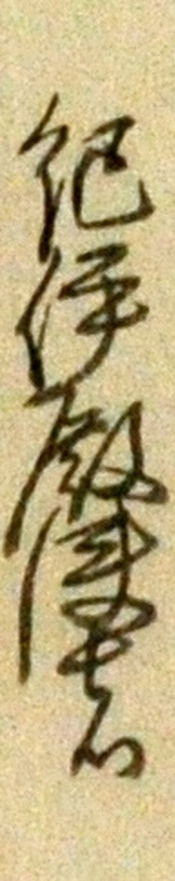紀伊殿使者
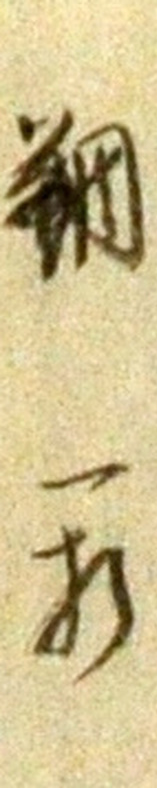鯛一折
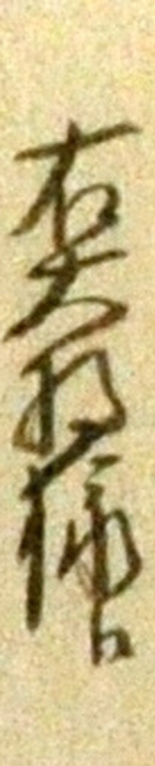右大将様え
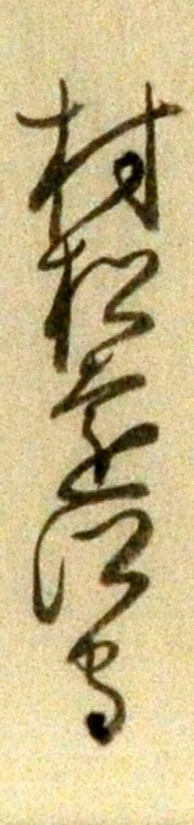村松遠江守
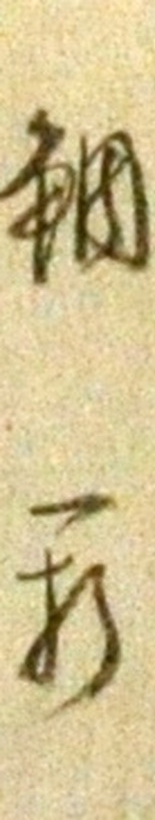鯛一折
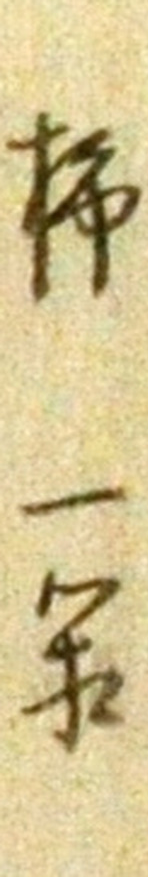柿一箱
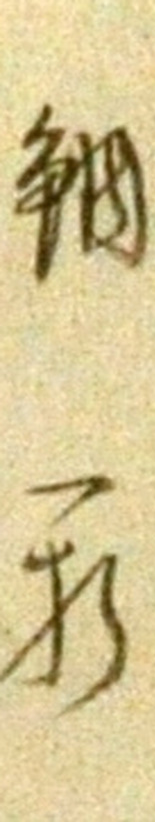鯛一折
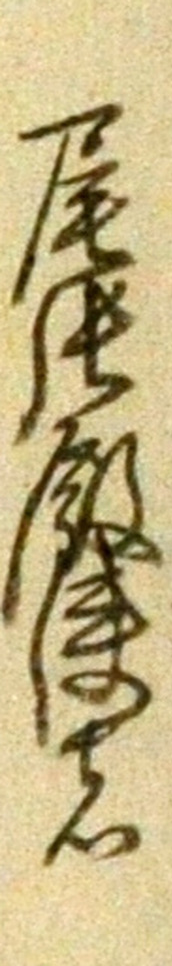尾張殿使者
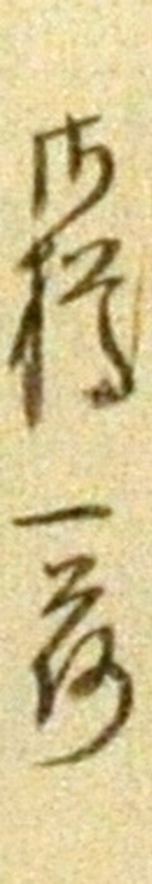御樽一荷
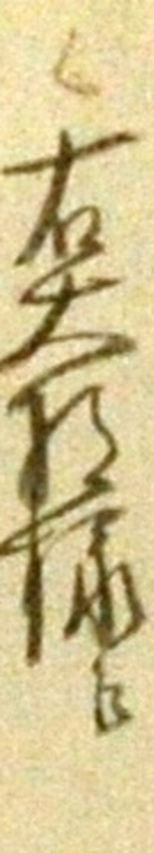右大将様え
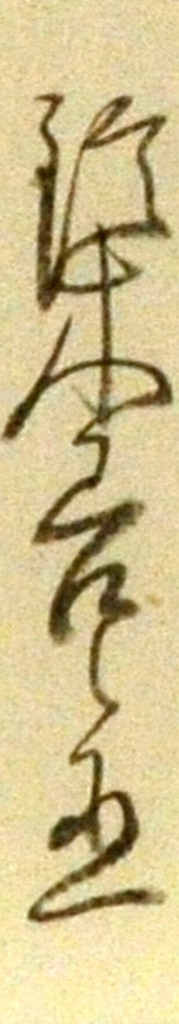鈴木善之丞
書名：御馳走御能ノ節ノ留外
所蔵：伊那市立高遠町図書館・合同会社AMANE
